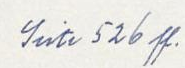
Seite 526 ff.
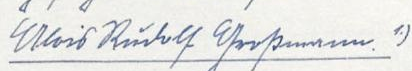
Alois Rudolf Großmann 1)
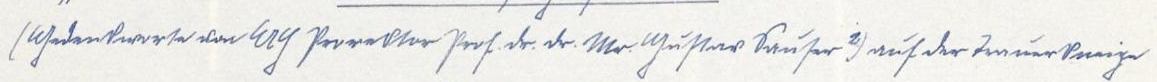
(Gedenkworte von AH Prorektor Prof. Dr. Dr. Mr. Gustav Sauser 2) auf der Trauerkneioe
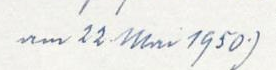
am 22. Mai 1950)
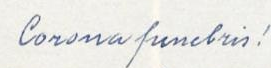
Corona funebris!
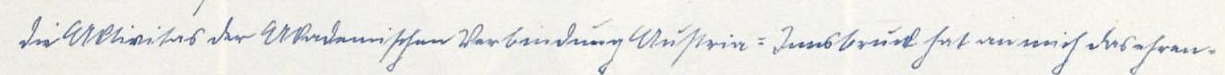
Die Aktivitas der akademischen Verbindung Austria-Innsbruck hat an mich das ehrend-
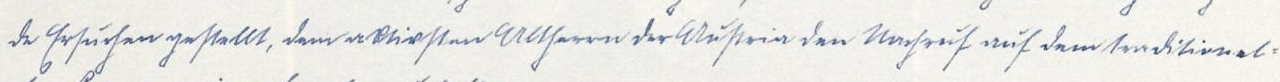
de Ersuchen gestellt, dem aktivsten Altherrn der Austria den Nachruf auf dem traditionel-
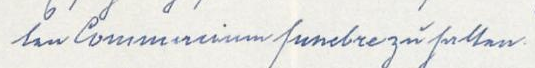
len Commercium funebre zu halten.
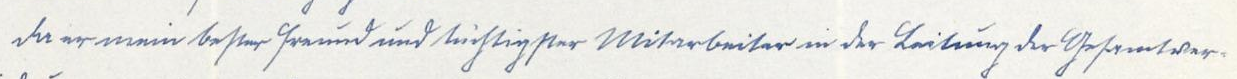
Da er mein bester Freund und tüchtigster Mitarbeiter in der Leitung der Gesamtver-
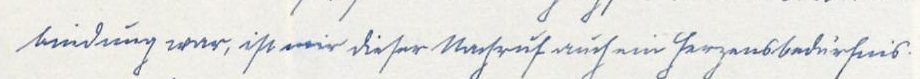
bindung war, ist mir dieser Nachruf auch ein Herzensbedürfnis.
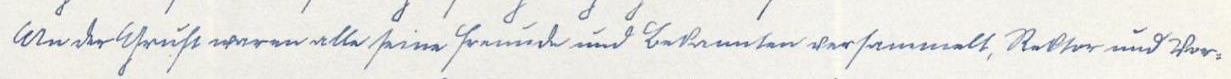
An der Gruft waren alle seine Freunde und Bekannten versammelt, Rektor und Vor-
